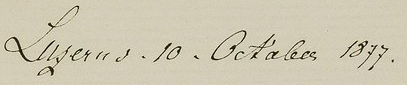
Luzern d. 10. October 1877.
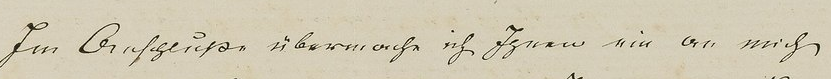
Im Anschluße übermache ich Ihnen ein an mich
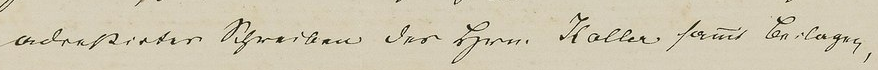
adreßirtes Schreiben des Hrn. Haller sammt Beilagen,
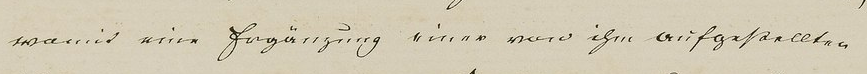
womit eine Ergänzung einer von ihm aufgestellten
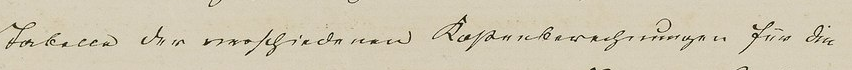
Tabelle der verschiedenen Kostenberechnungen für die
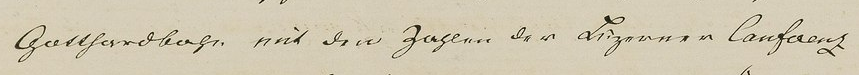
Gotthardbahn mit den Zahlen der Luzerner Conferenz
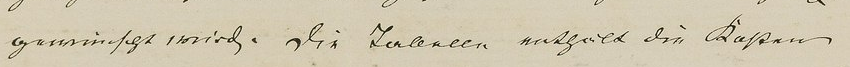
gewünscht wird. Die Tabelle enthält die Kosten
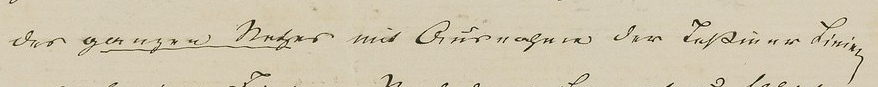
des ganzen Netzes mit Ausnahme der Teßiner Linien
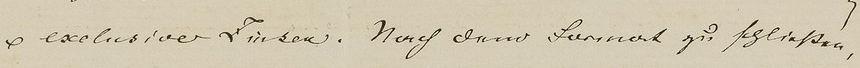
& exclusive Zinsen. Nach dem Format zu schließen,
